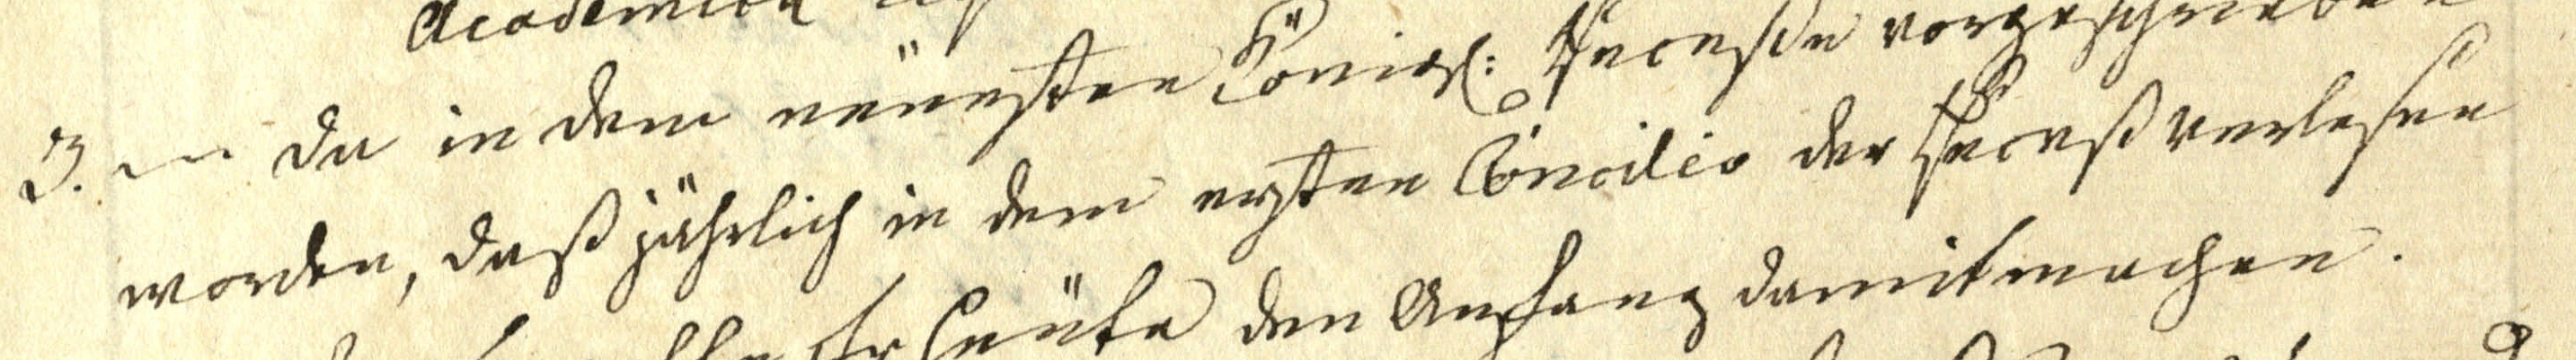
worden, daß jährlich in dem ersten Concilio der Receß verlesen
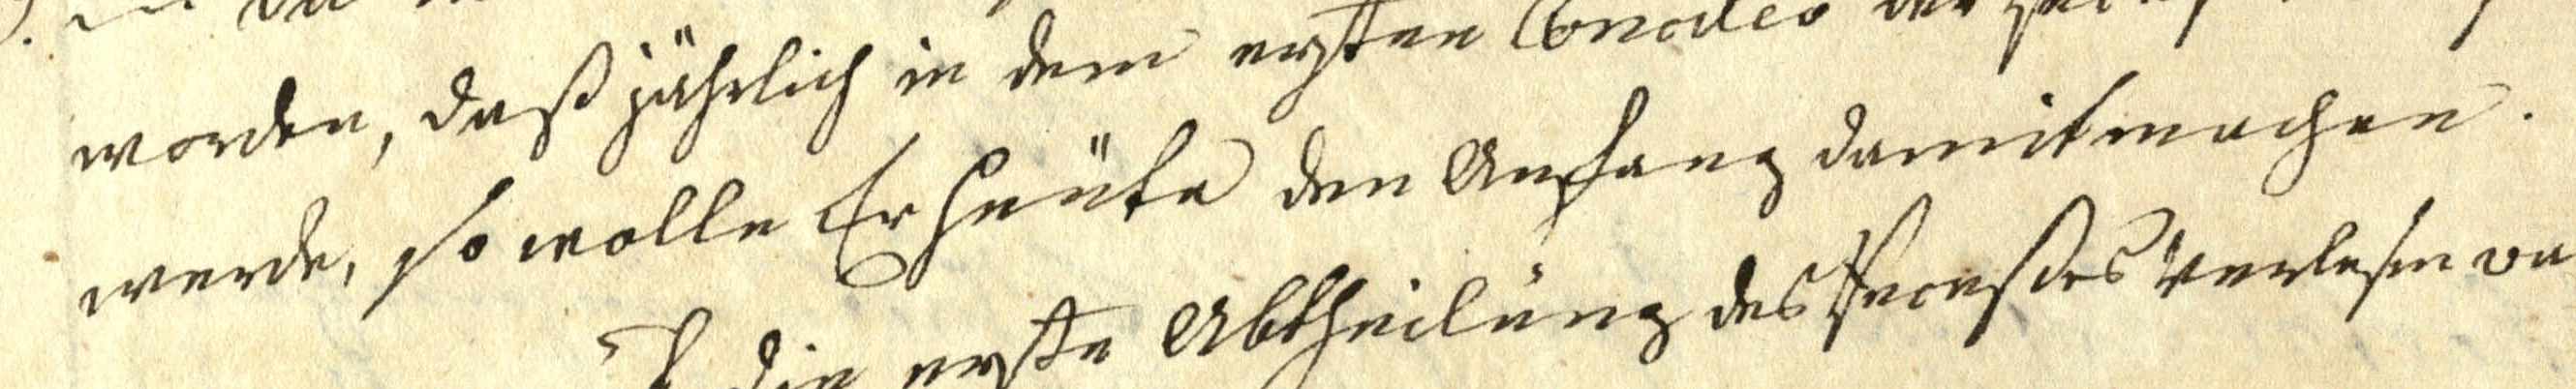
würde, so wolle Er heute den Anfang damitmachen.
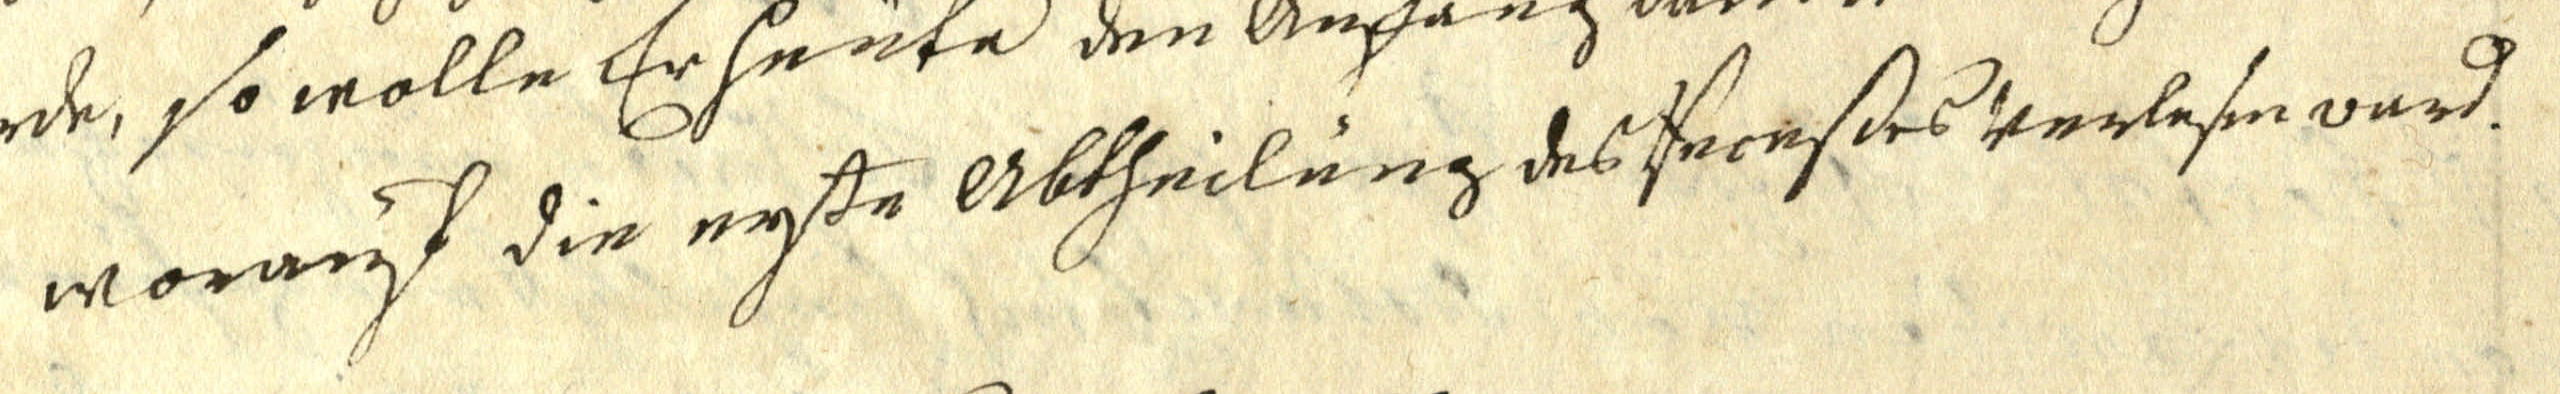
worauf die erste Abtheilung des Receßes verlesen ward.
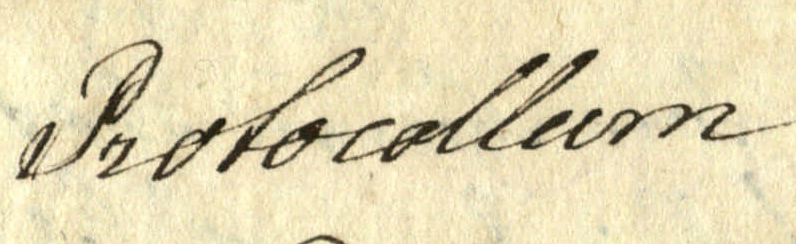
Protocollum
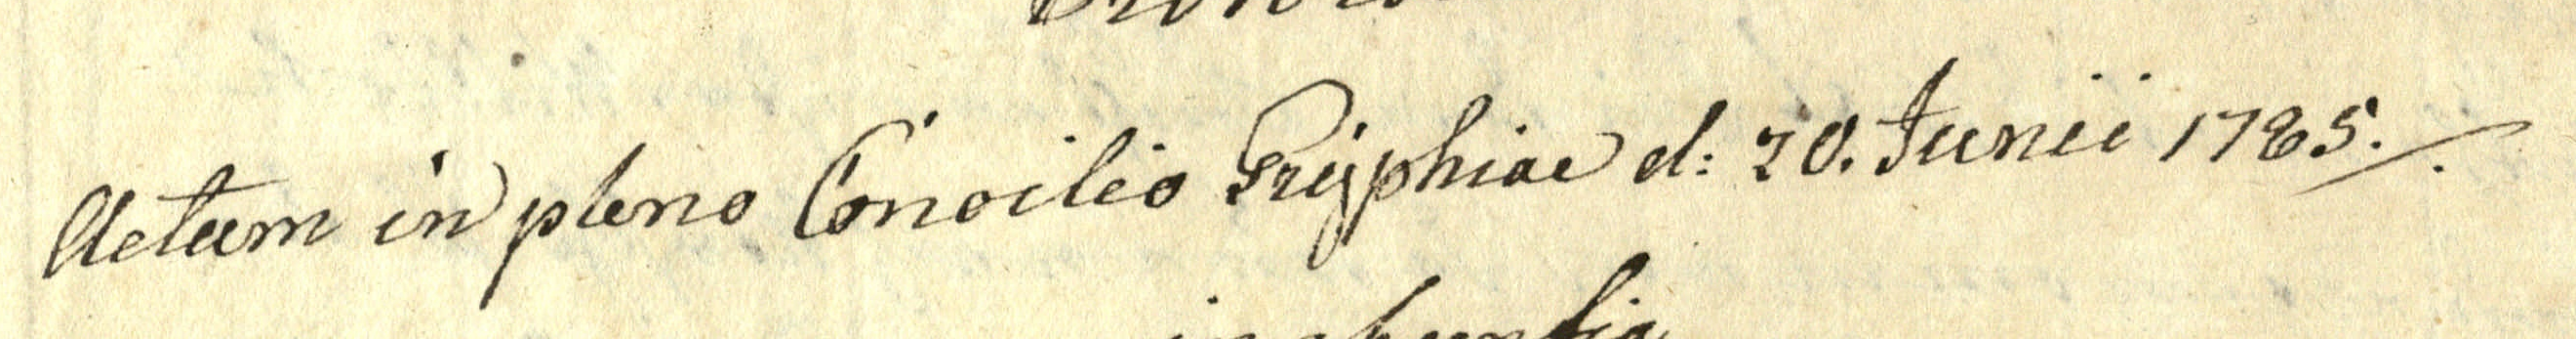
Actum in pleno Concilio Grÿphiae d. 10. Junii 1785
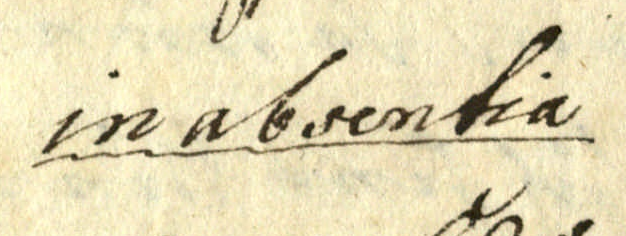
in absentia
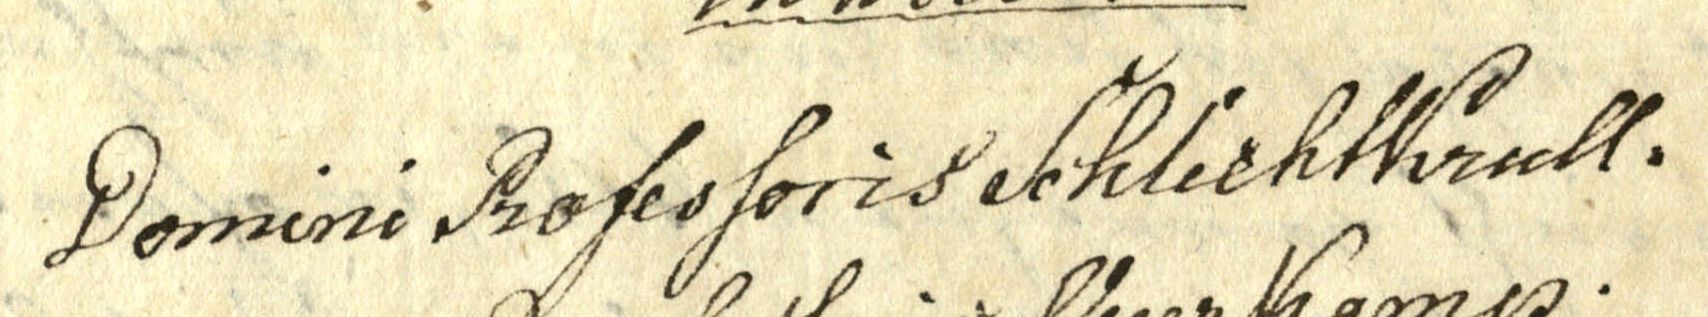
Domini Professoris Schlichtkrull.
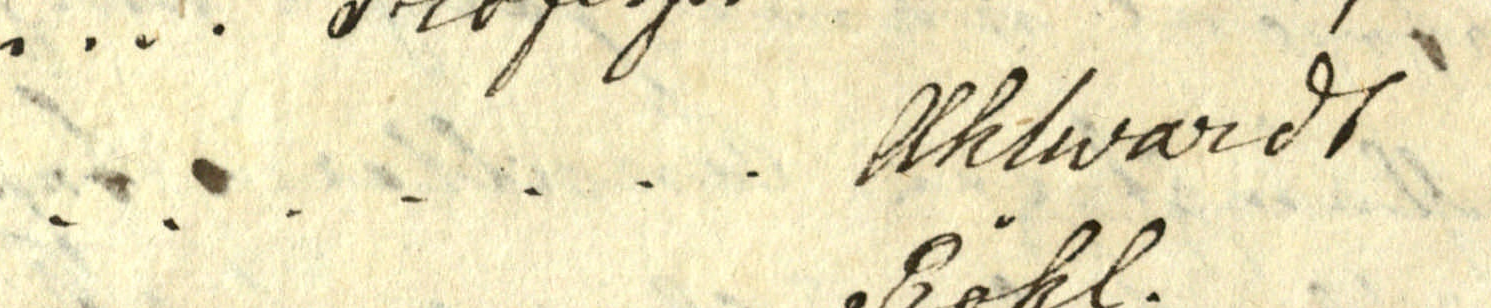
Ahlwardt
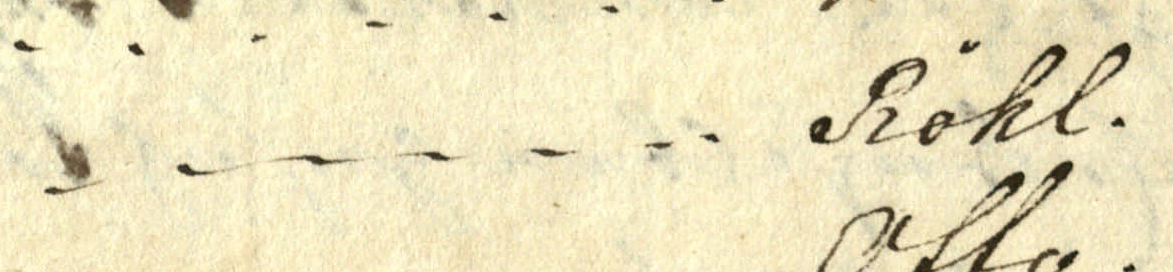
Röhl.
